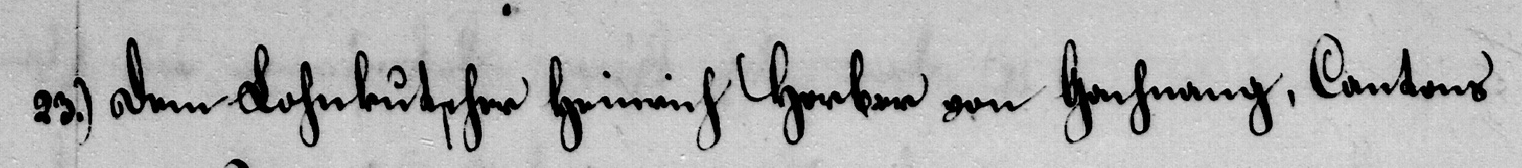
23.) Dem Lohnkutscher Heinrich Horber von Gachnang, Cantons
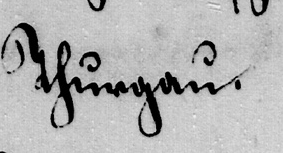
Thurgau.
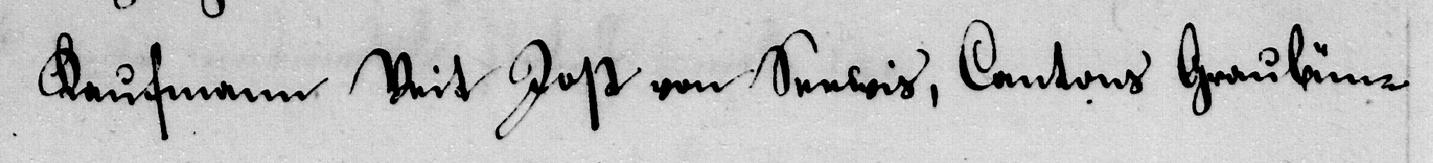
Kaufmann Veit Jost von Seewis, Cantons Graubün¬
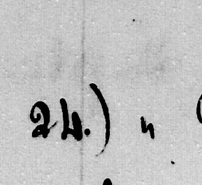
34.)
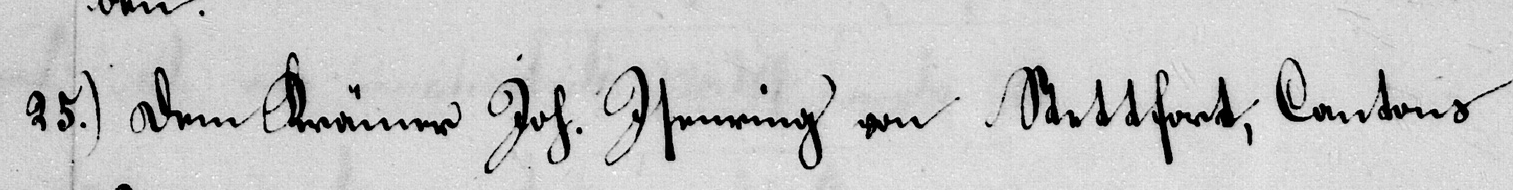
25.) Dem Krämer Joh. Isenring von Stettfort, Cantons
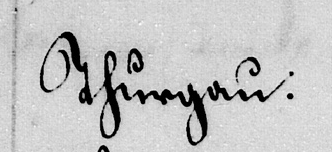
Thurgau.
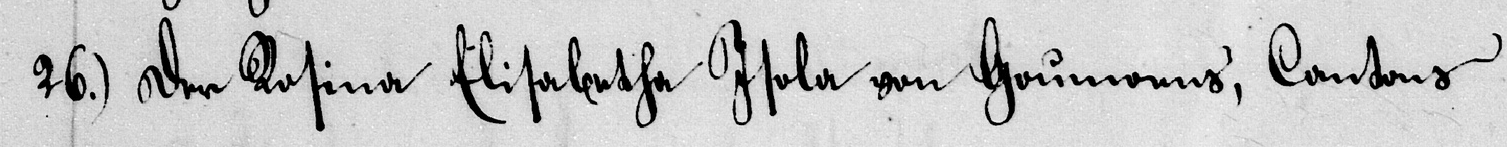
26.) Der Rosina Elisabetha Isola von Goumoens, Cantons
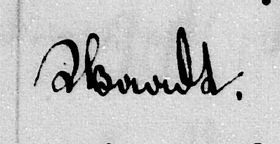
Waadt.
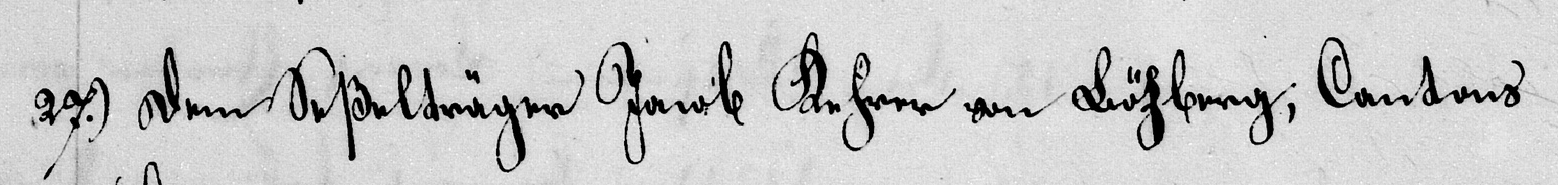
27.) Dem Seßelträger Jacob Kehrer von Bözberg, Cantons
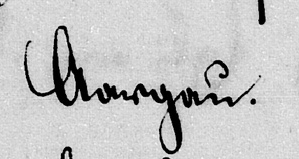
Aargau.
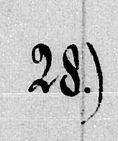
28.)
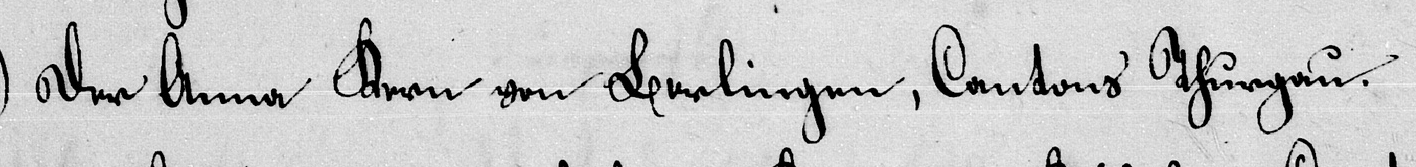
Der Anna Kern von Berlingen, Cantons Thurgau.
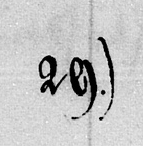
29.)
